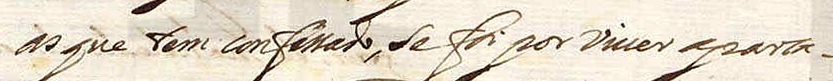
as que tem confessado, se foi por viuer aparta
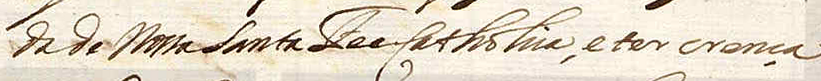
da de Nossa santa Fee Catholica, e ter crença
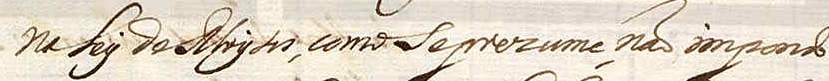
na Ley de Moyses, como se prezume, naõ impondo
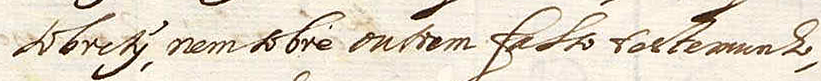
sobre sy, nem sobre outrem falso testemunho,
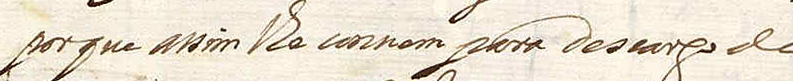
por que assim lhe convem para descargo de
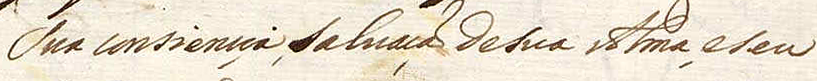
Sua consiencia, salvaçaõ de sua Alma, e seu
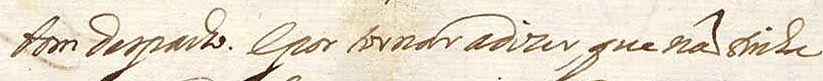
bom despacho. E por tornar a dizer, que naõ tinha
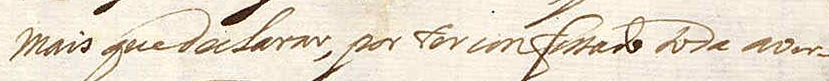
mais que declarar, por ter confessado toda a ver
